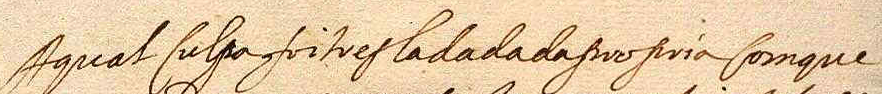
A qual Culpa foi tresladada da propria Com que
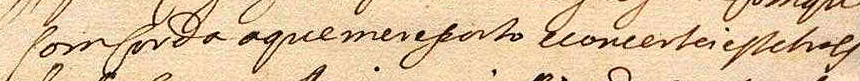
ComCorda a que me reporto e concertei este tres
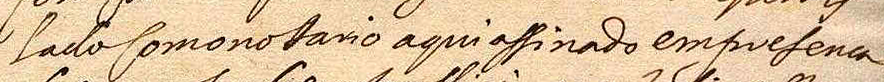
lado Com o notario aqui assinado em presença
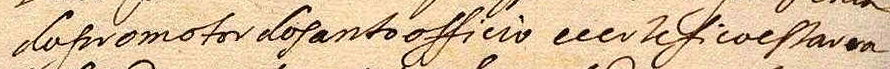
do promotor do santo officio e certefico estar ra
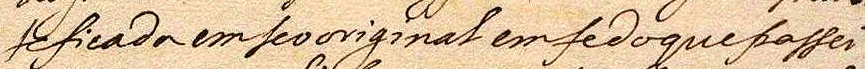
teficada em seo original em fe do que passei
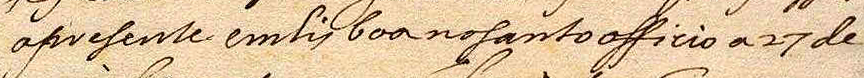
a presente em lisboa no santo officio a 27 de
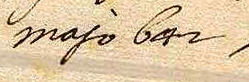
majo 642 /
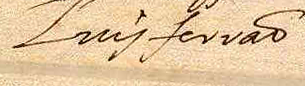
Luis ferraõ
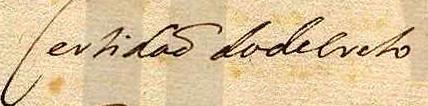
Certidaõ do decreto
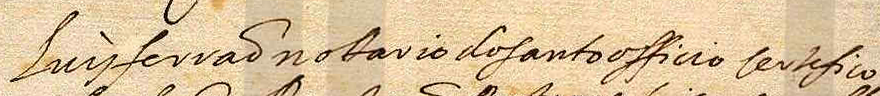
Luis ferraõ nottario do santo officio Certefico
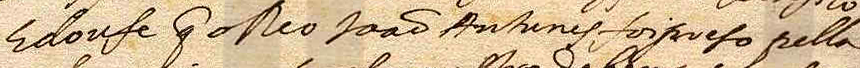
E dou fe q̄ o Reo Joaõ Antunes foi preso pella
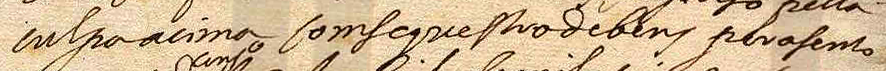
culpa acima Com sequestro de bens per asento
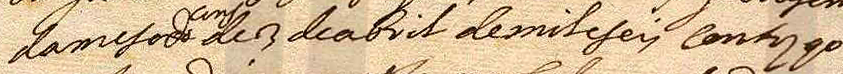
da mesa do conso de 3 de abril de mil e seiscentos qo
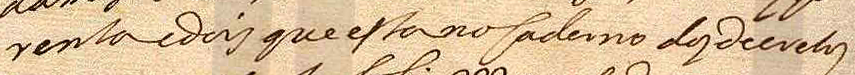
renta e dois que esta no Caderno dos decretoz
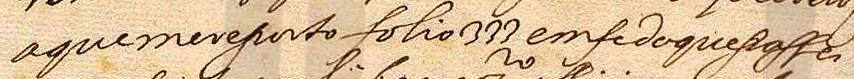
a que me reporto folio 333 em fe do que passei
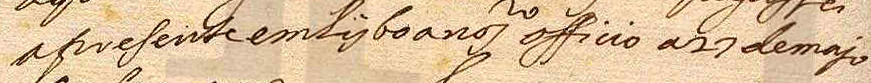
a presente em Lisboa no sto officio a 27 de majo
